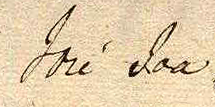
Iozé Joā
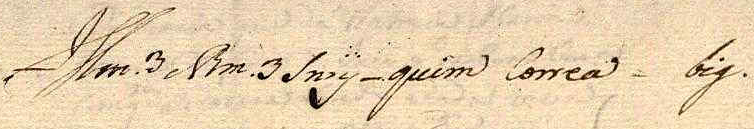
Illm.os e Rm.os Snres -quim Correa - vig.
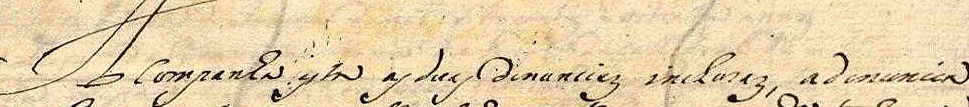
Acompanha esta as duas denunciaz incluzaz, a denuncia
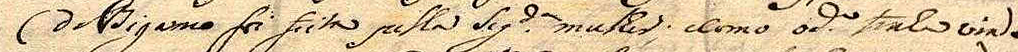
de Bigamo foi feita pella seg.da mulher; e como o d.o tinha vindo
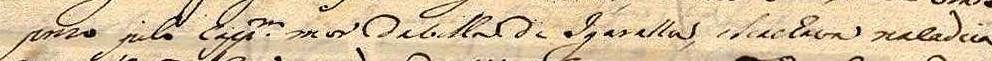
prezo pelo Capp.m mor da villa de Igarassu, e se achava na cadeia
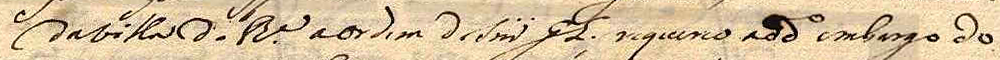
da villa do R.a a ordem do Snr̄ GL; requereo ao do embargo do
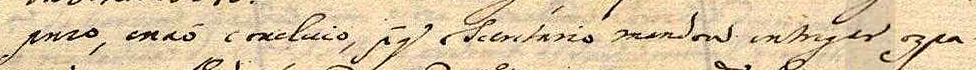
prezo, e naõ concluio, p̄q o Secretario mandou entregar os pa
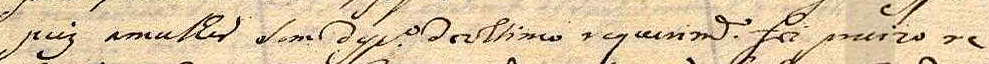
peiz a mulher sem desp.o do vltimo requerim.to foi precizo re
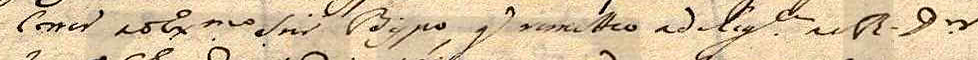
Correr ao Ex.mo Snr̄ Bispo, q̄ remetteo a delig.a ao R. D.or
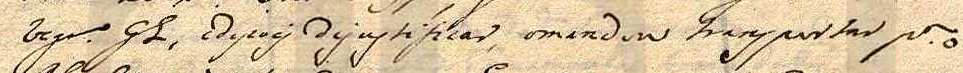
Vigr.o GL, e depois de justificar, o mandou transportar p.a o
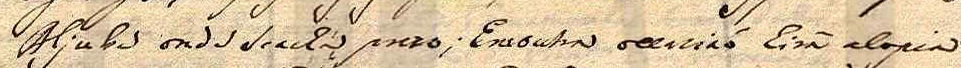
Aljube onde se acha prezo; Em outra occaziaõ hirá a Copia
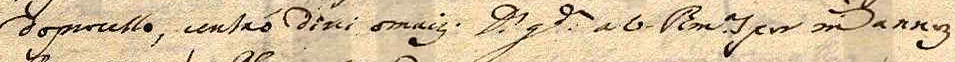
do processo, e entaõ direi o maiz. D.s gde a v. Rm.as por m̄ annoz
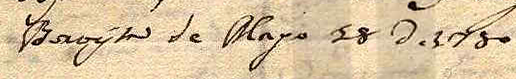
Boa vista de Mayo 28 de 1780
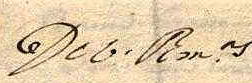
De V. Rm.as
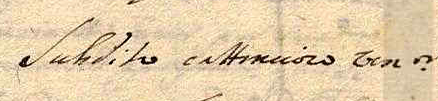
Subdito e attenciozo veno.r
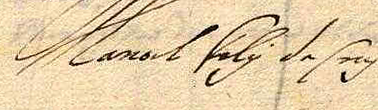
Manoel Felis da Crus
